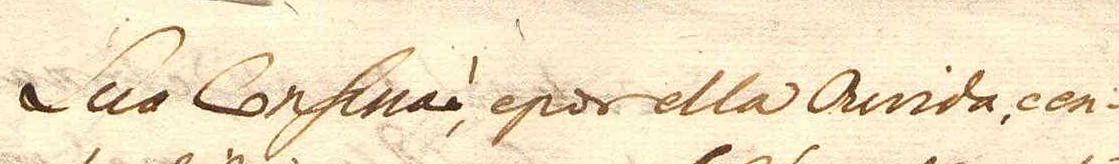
Sua Confissaõ, e por ella Ouvida, e en
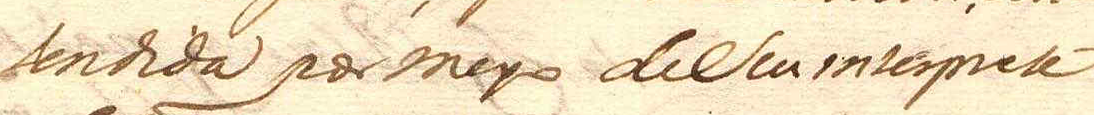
tendida por meyo de seu interprete
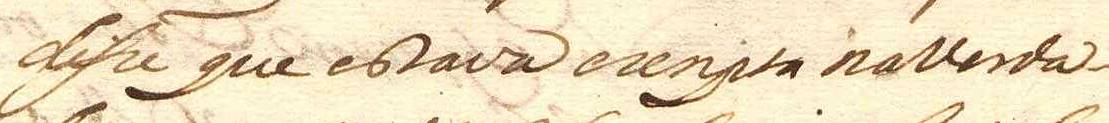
disse que estava escripta na verda
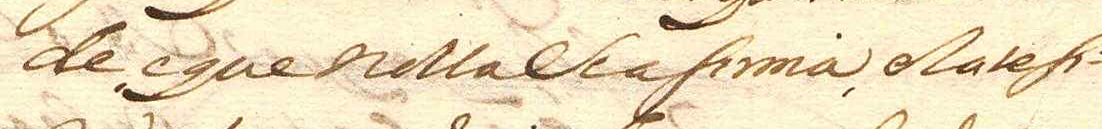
de, e que nella se afirma, e Ratefi
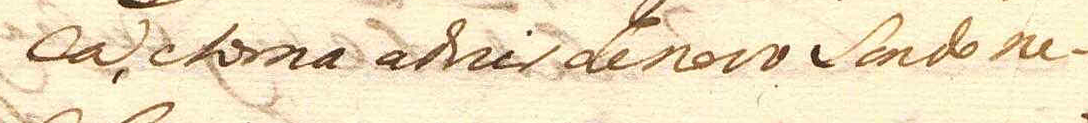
ca, e torna a dizer de novo sendo ne
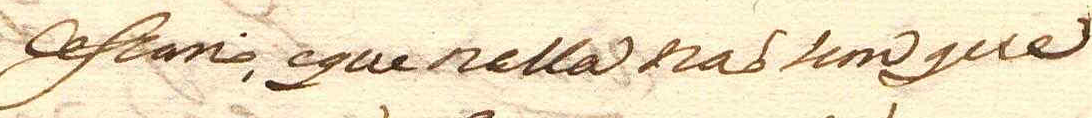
cessario, e que nella naõ tem que
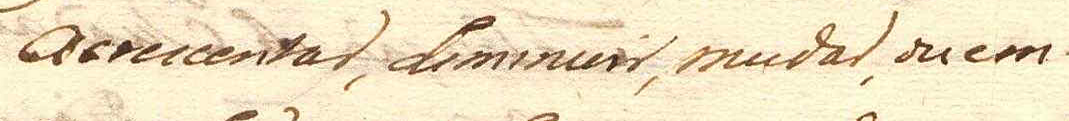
acrescentar, diminuir, mudar, ou em
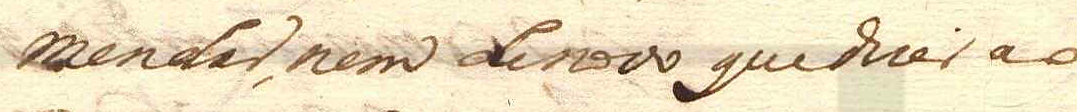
mendar, nem de novo que dizer ao
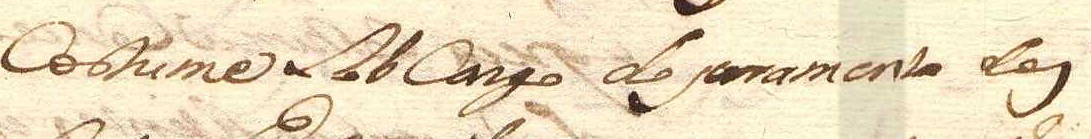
Costume sob Cargo do juramento dos
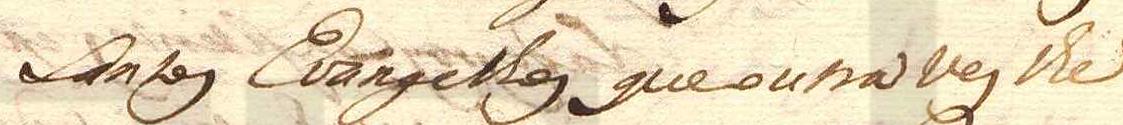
Santos Evangelhos que outra ves lhe
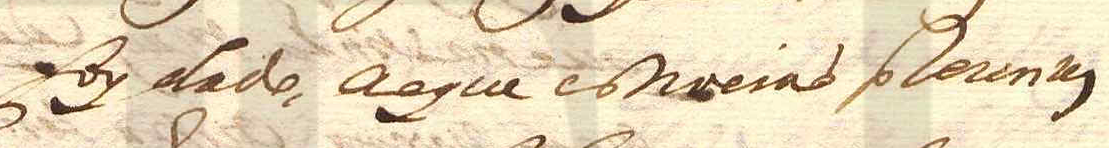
foy dado, ao que estiveraõ pRezentes
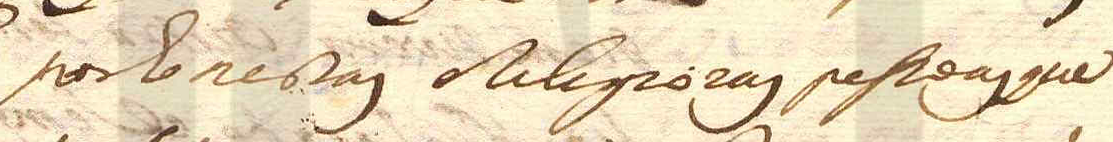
por honestas e Religiozas pessoas que
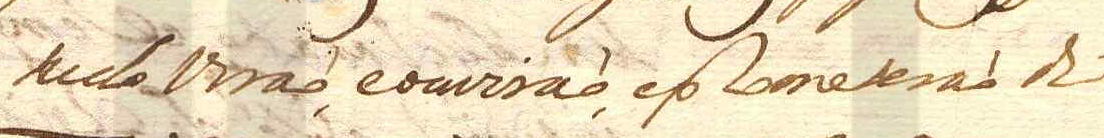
tudo viraõ, e ouviraõ e pRometeraõ di
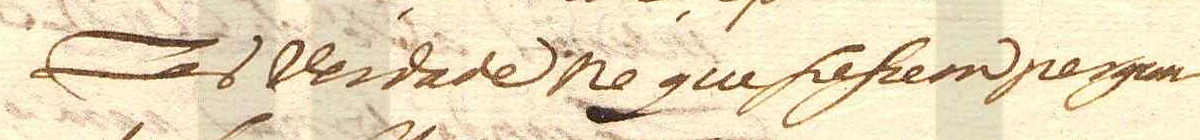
Zer verdade no que fossem pergun
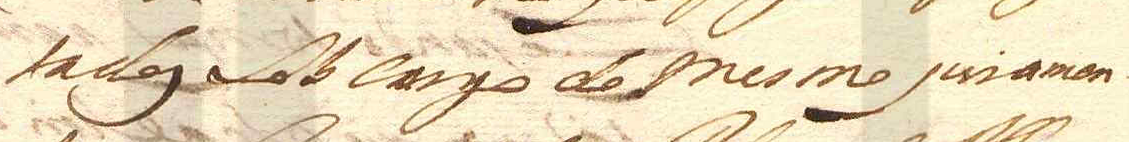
tados sob cargo do mesmo juramen
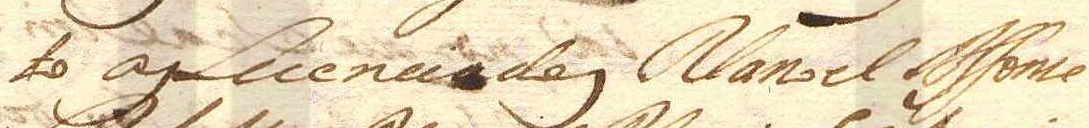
to os Licenciados Manoel Affonso
